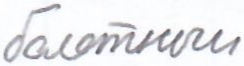болотныи
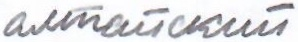алтайский
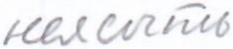неясыть
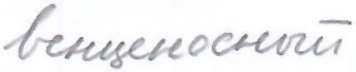венценосный
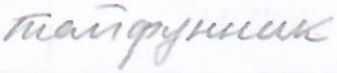тайфунник
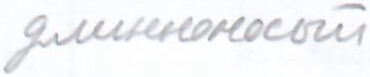длинноносый
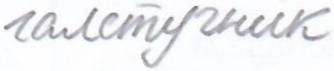галстучник
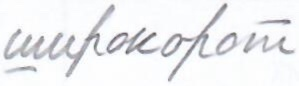широкорот
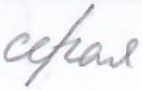серая
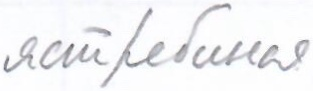ястребиная
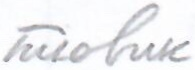тювик
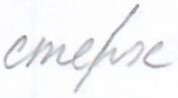стерх
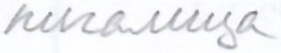пигалица
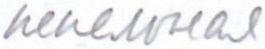пепельная
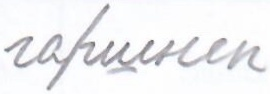гаршнеп
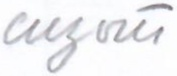сизый
